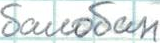балобан
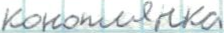коноплянка
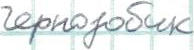чернозобик
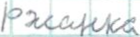ржанка
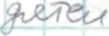дятел
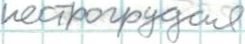пестрогрудая
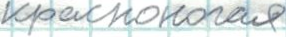красноногая
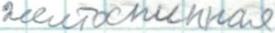желтоспинная
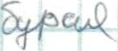бурая
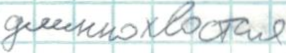длиннохвостая
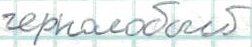чернолобый
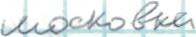московка
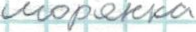морянка
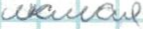малая
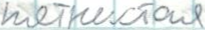пятнистая
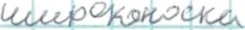широконоска
